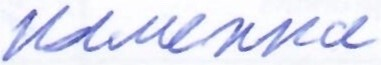каменка
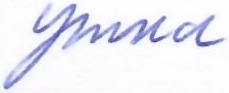утка
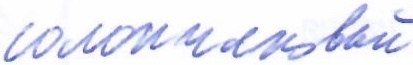солончаковый
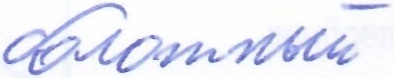болотный
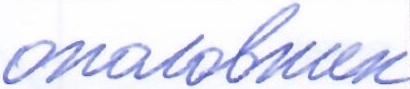ополовник
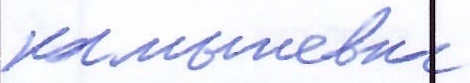камыневка
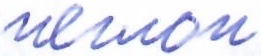чеглок
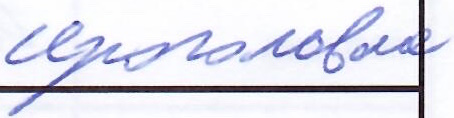сероголовая
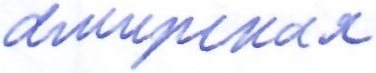амирская
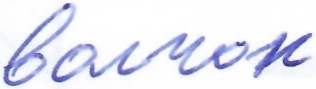волчок
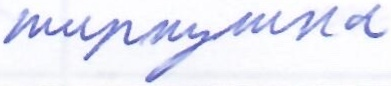тиркушка
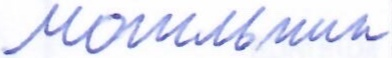могильник
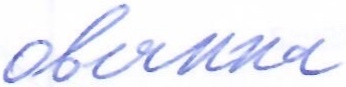овсянка
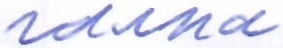галка
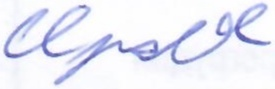серая
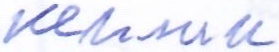кеклик
